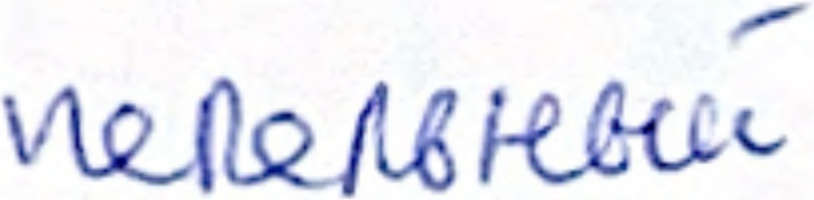пепельный
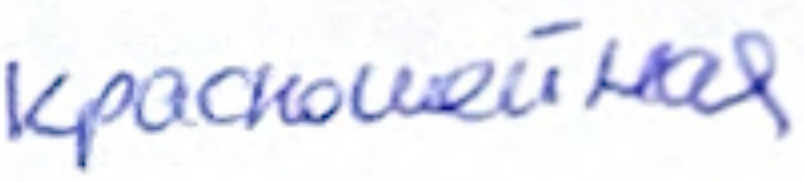красношейная
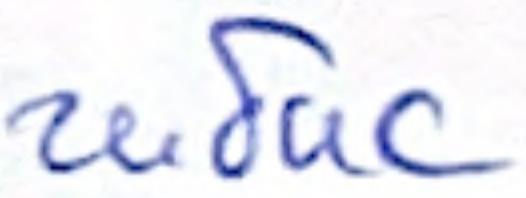чибис
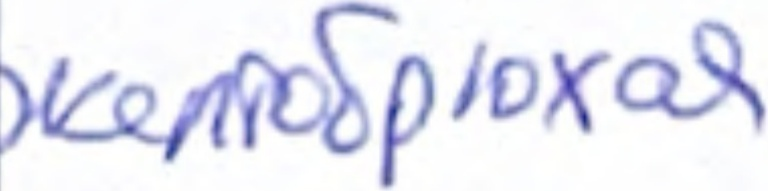желтобрюхая
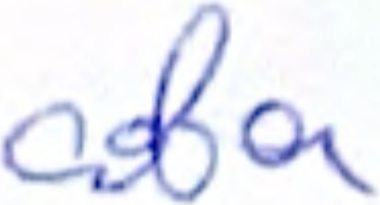сова
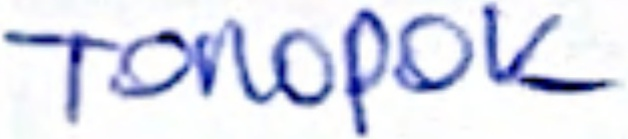топорок
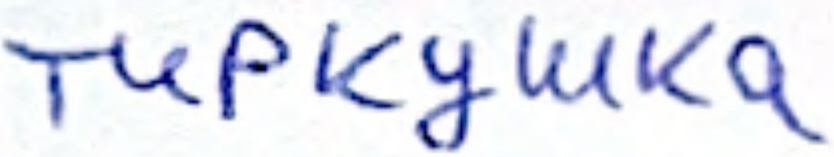тиркушка
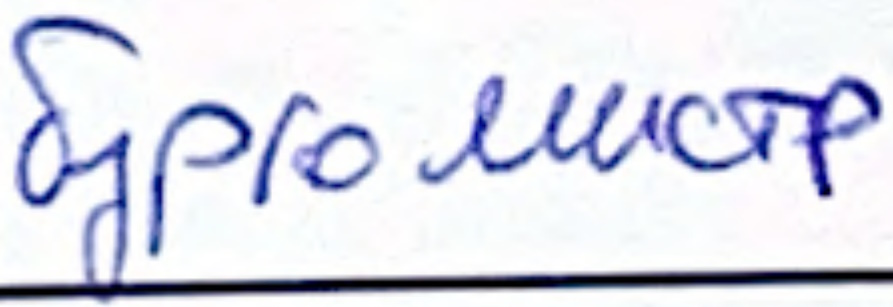бургомистр
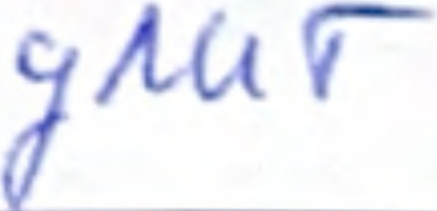улит
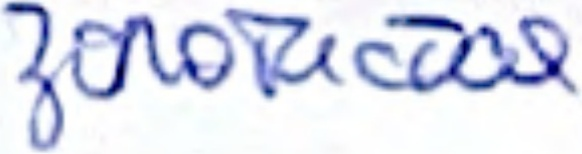золотистая
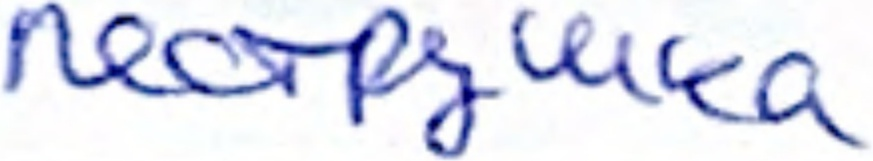пеструшка
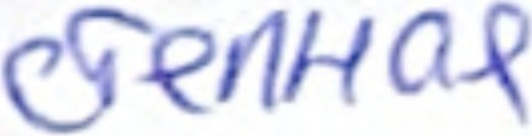степная
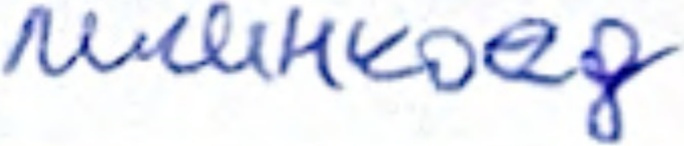лечинкоед
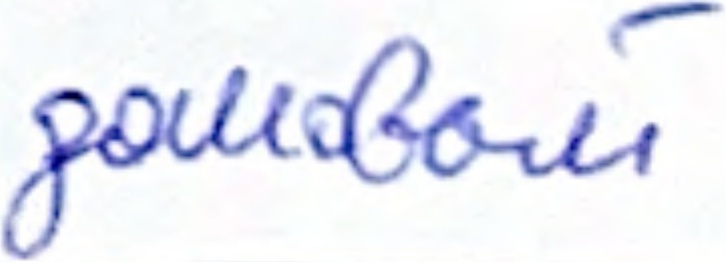домовый
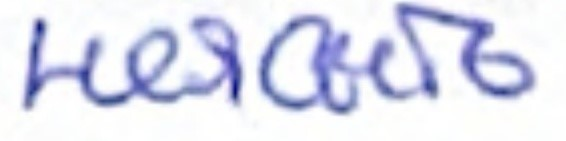неясыть
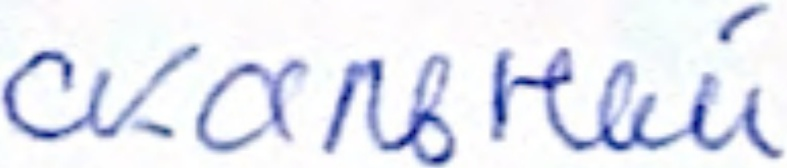скальный
